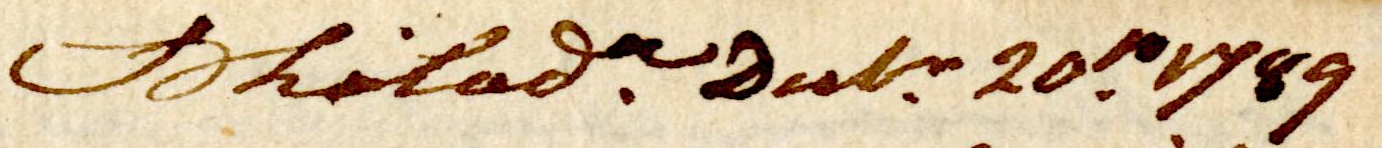Philad^a. Decb^r. 20^th. 1789
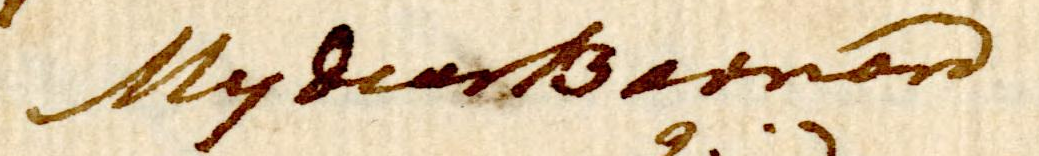My dear Barnard
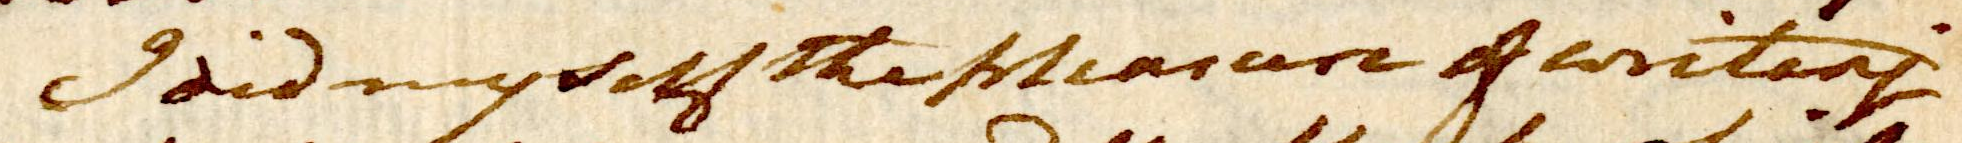I did myself the pleasure of writing
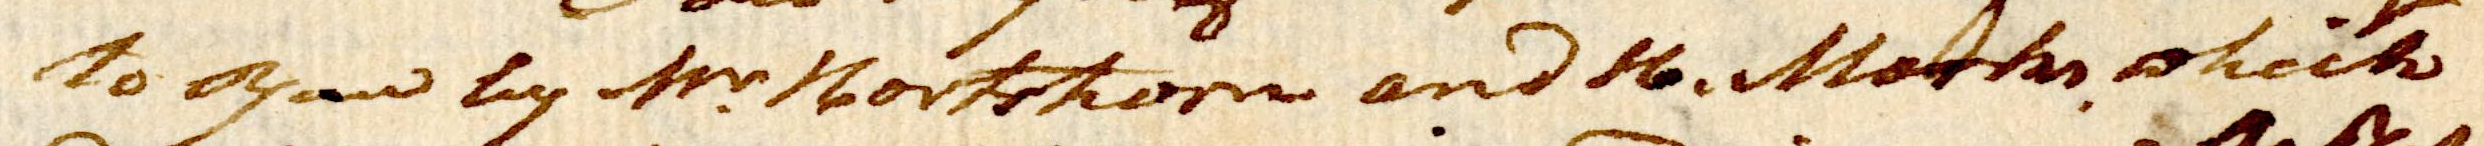to you by M^r. Northorn and Mr. Marks which
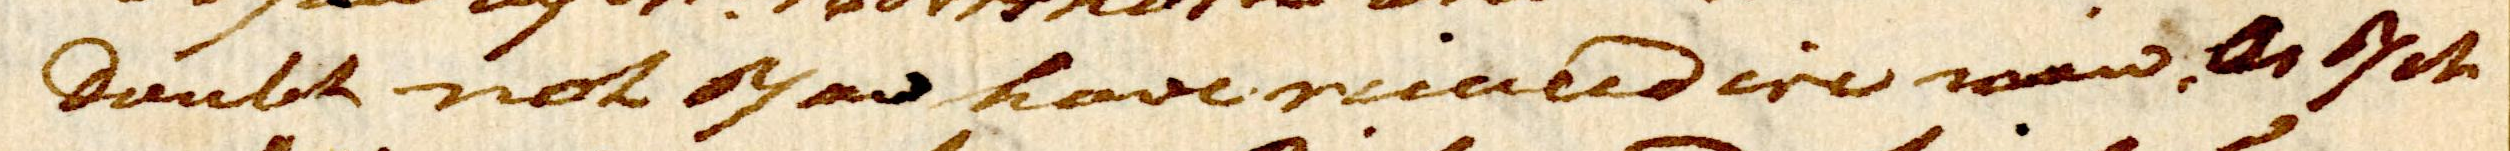doubt not you have recieved in now as yet
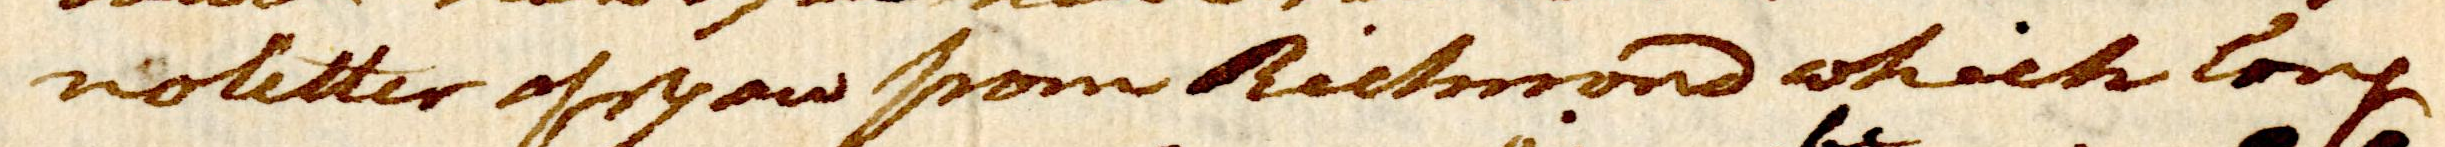no letter of you from Richmond which long
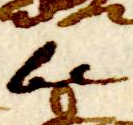be
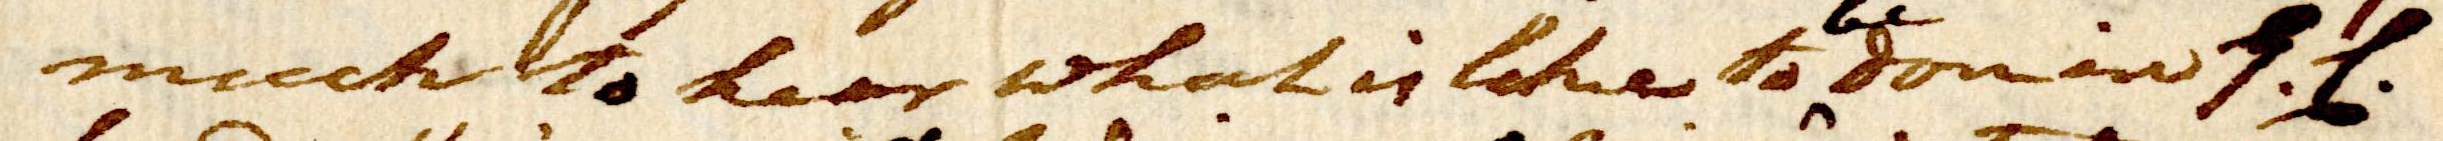much to hear what is like to ^ don in G. C.
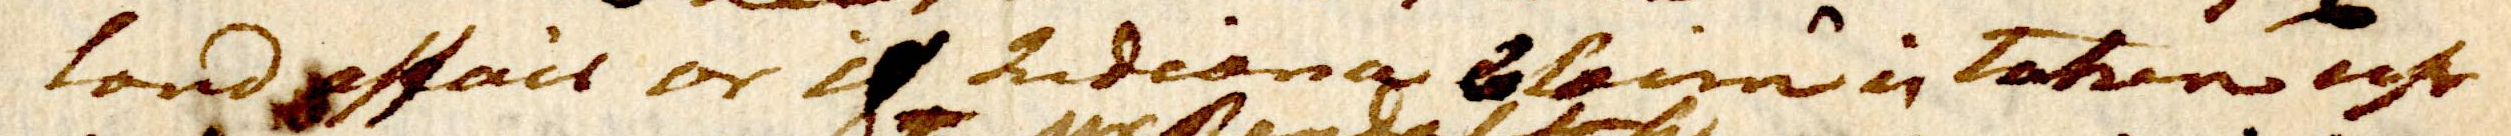land affair or if Indiana affair is taken up
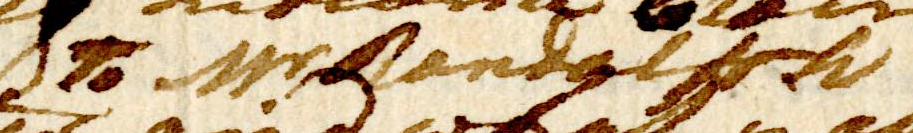to M^r. Randolph
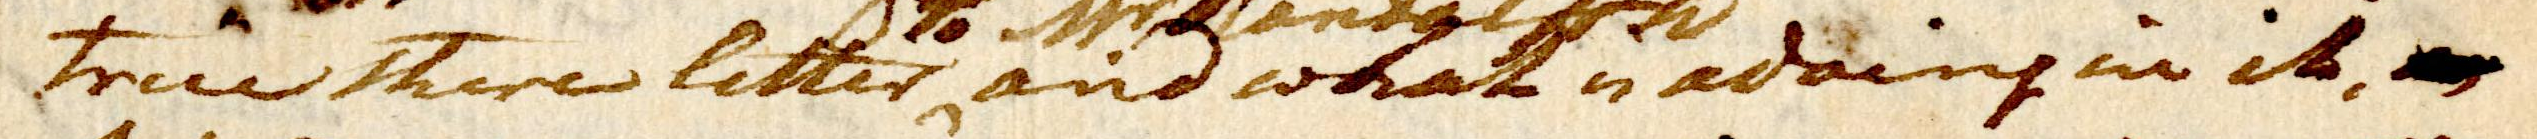true there letter ^ and what is adoing in it,
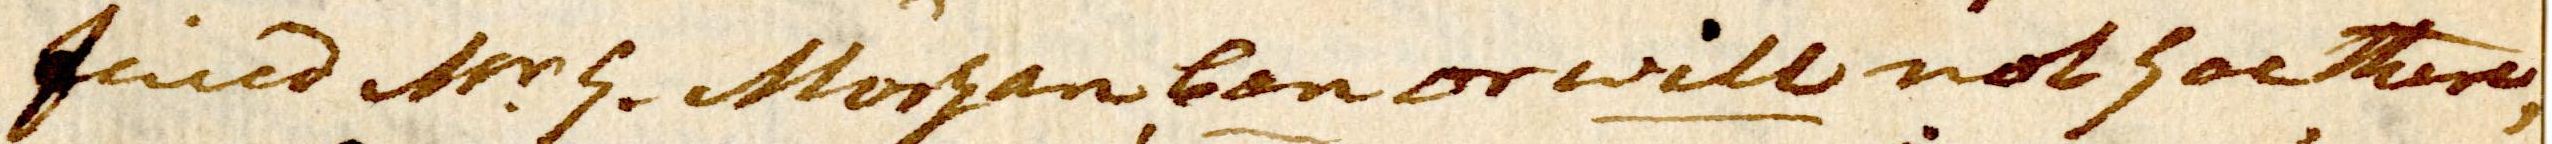Fined M^r G. Morgan can or will not goe there,
